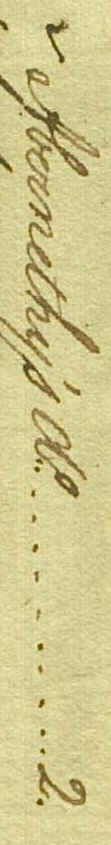- Abernethy's d^o. ........ 2.
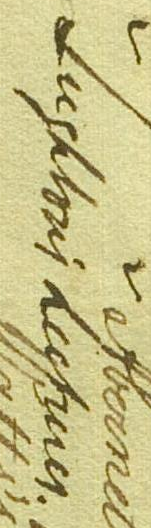Lughton's Lectures.
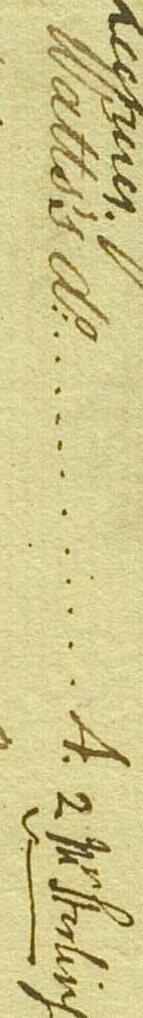Watts's d^o............ 4. 2 M^r. Sterling
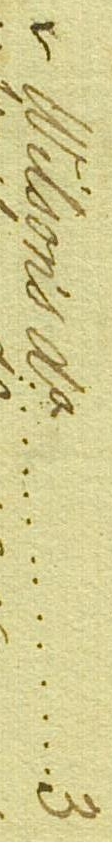- Wilson's d^o.......3
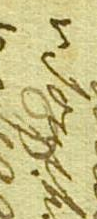- Souths
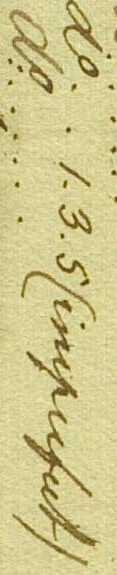d^o.. 1. 3. 5(imperfect)
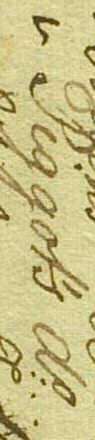- Piggot's d^o.
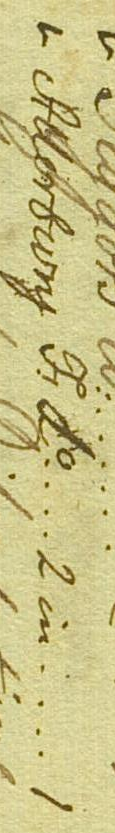- Atterbury F: d^o...2 in....1
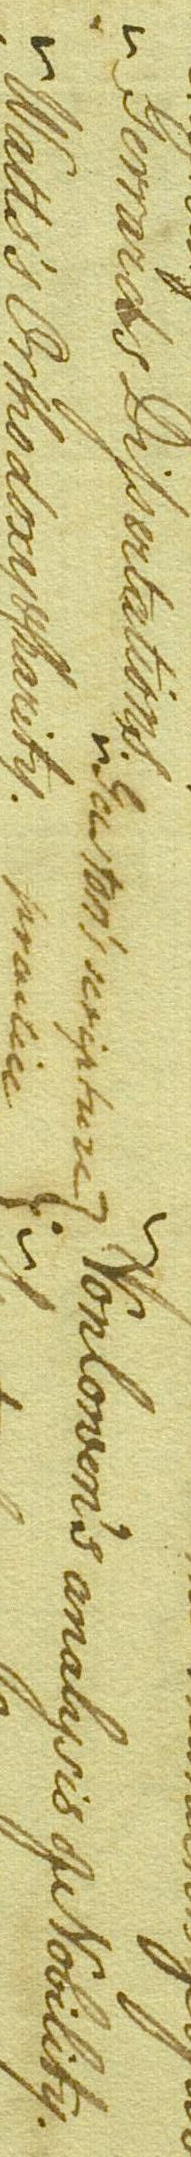- Gerrards Dissertations. -Gewton's scripture -Vonlowen's analysis of Nobility.
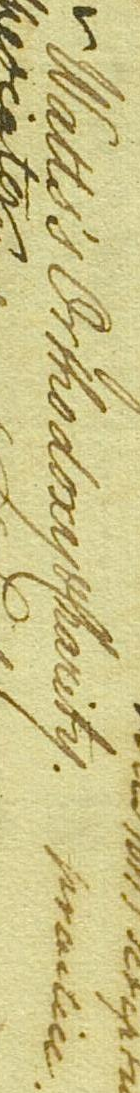- Watts's Orthodoxy of Charity. practice.
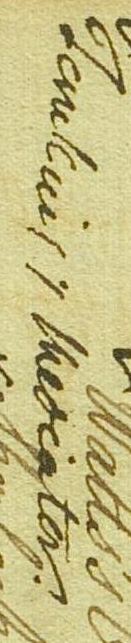- Jenkins mediator.
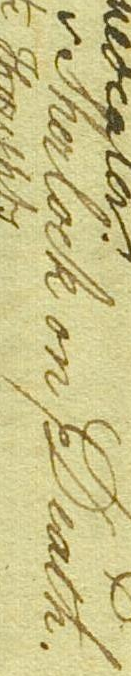- Sherlock on Death.
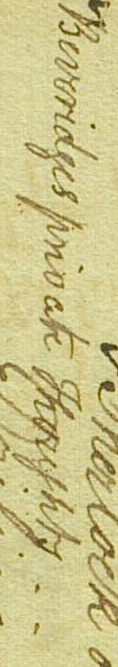Beveridges private Thoughts
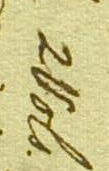2 Vols.
